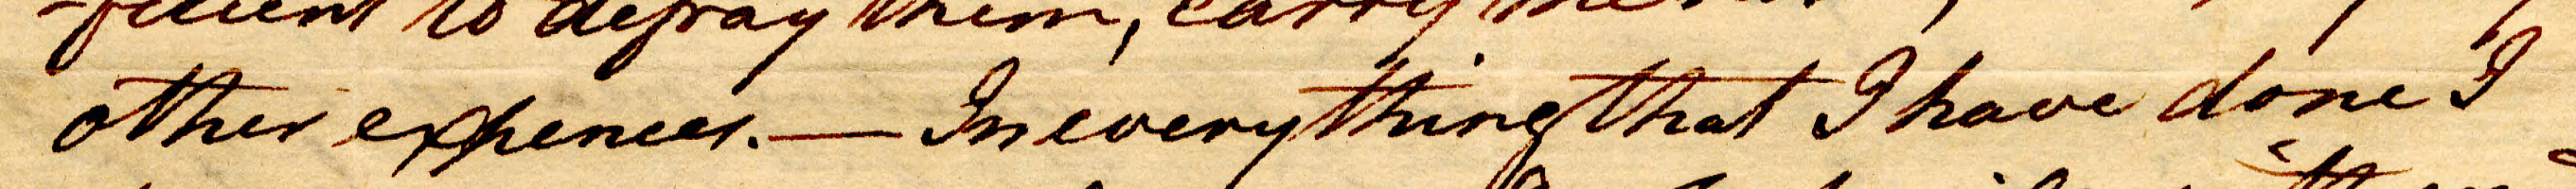other expences.- In every thing that I have done I
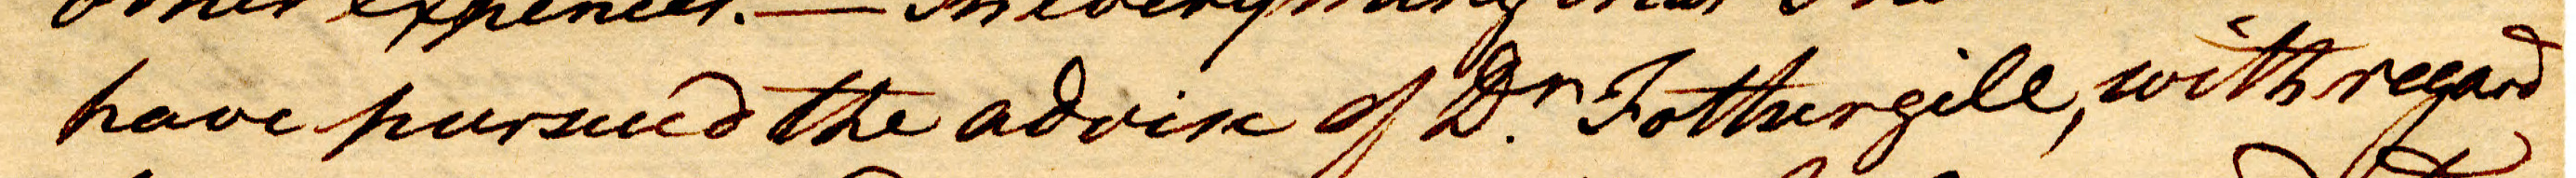have pursued the advice of D^r. Fothergill, with regard
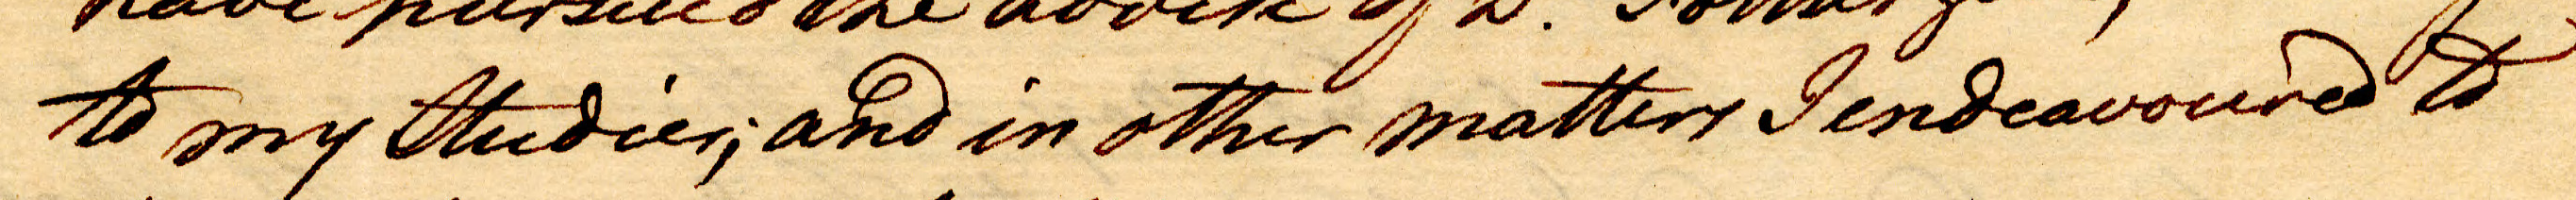to my Studies; and in other matters I endeavoured to
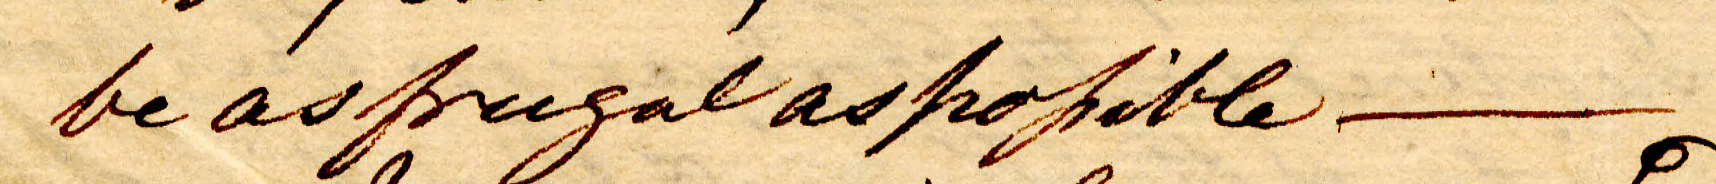be as frugal as possible-
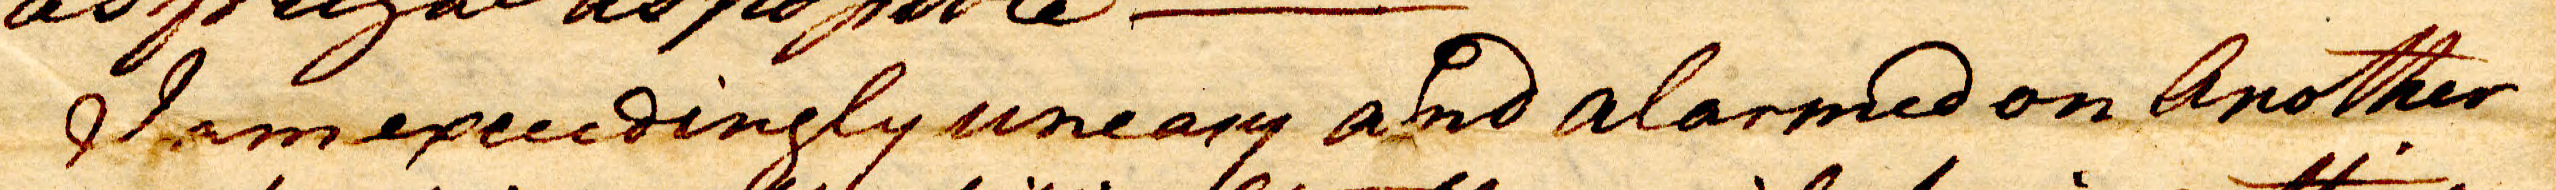I am exceedingly uneasy and alarmed on Another
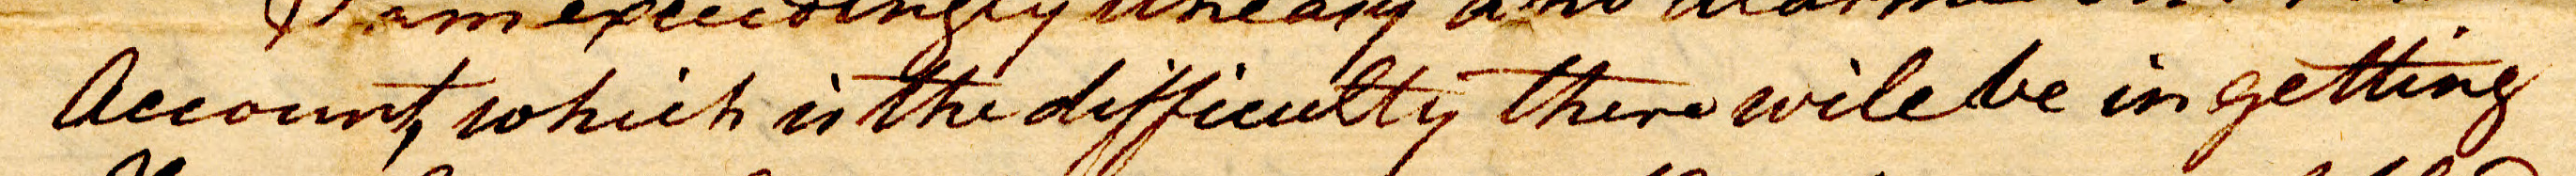Account, which is the difficulty there will be in getting
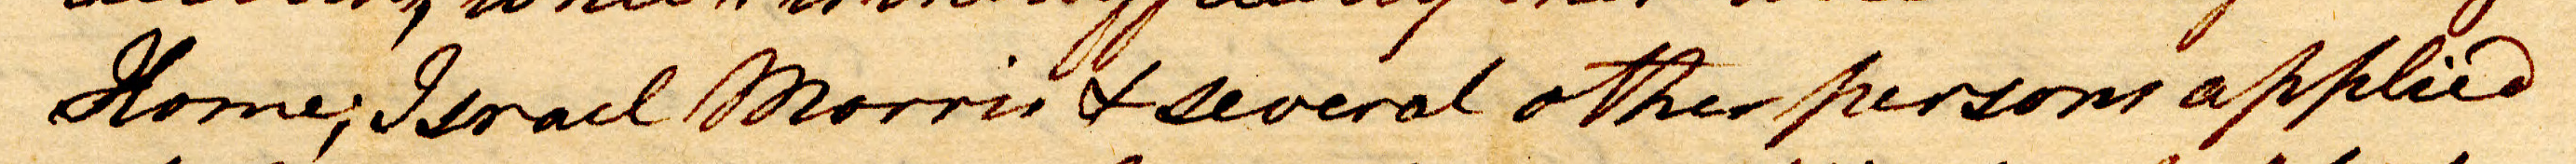Home; Israel Morris & several other persons applied
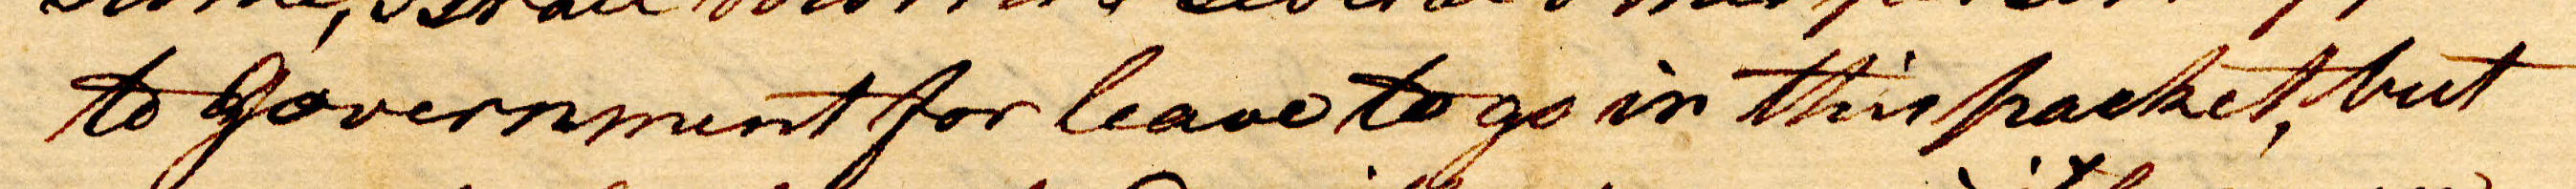to government for leave to go in this packet, but
